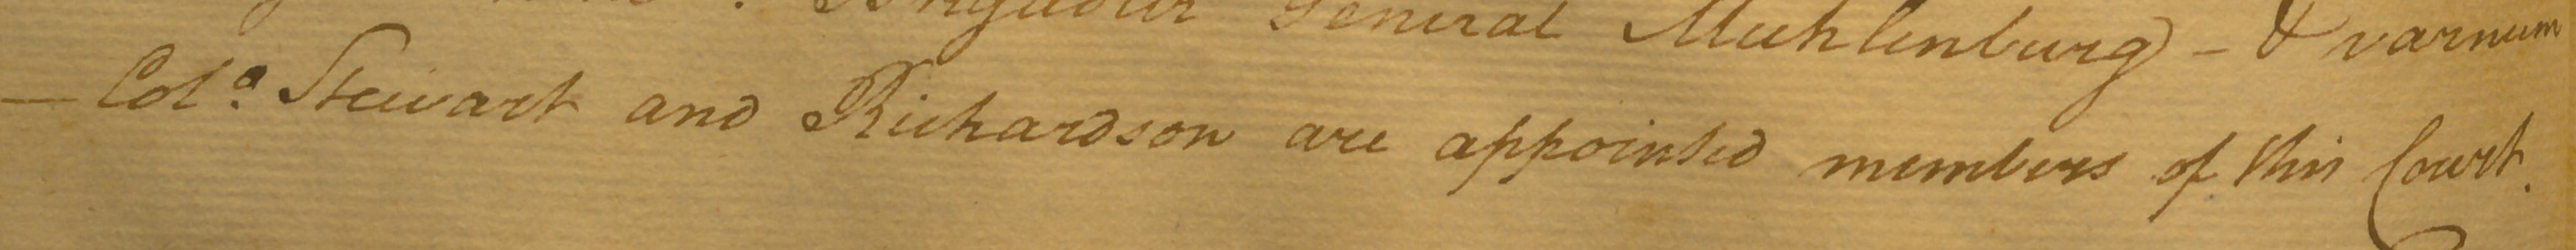-Col^o. Stewart and Richardson are appointed members of this Court.
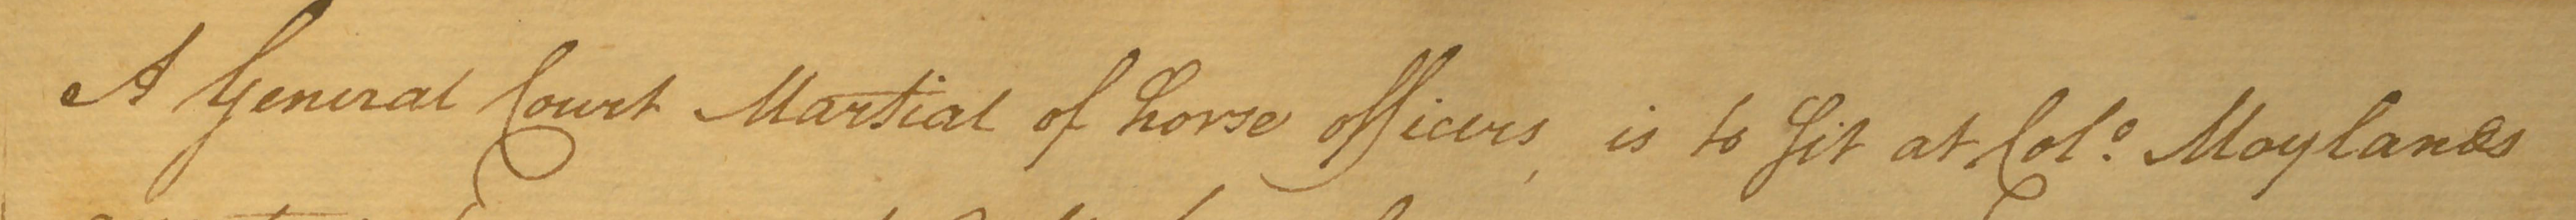A General Court Martial of horse officers is to sit at Col^o. Maylands
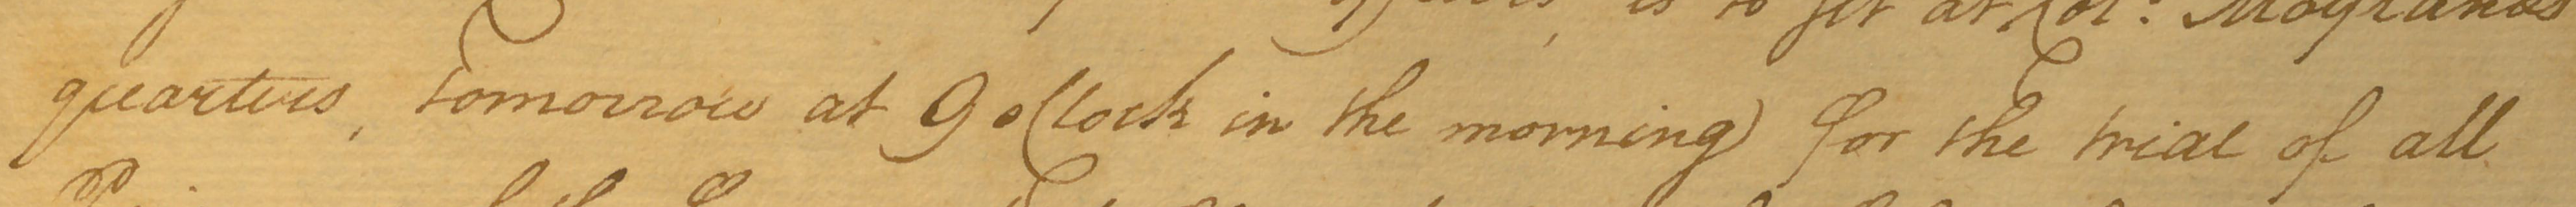quarters, tomorrow at 9 oClock in the morning for the trial of all
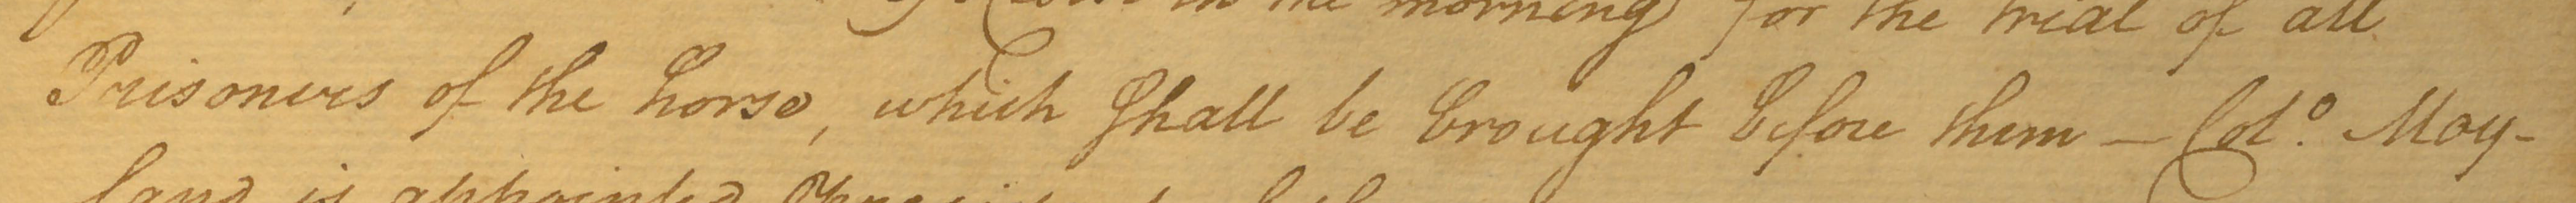Prisoners of the horse, which shall be brought before them- Col^o. May-
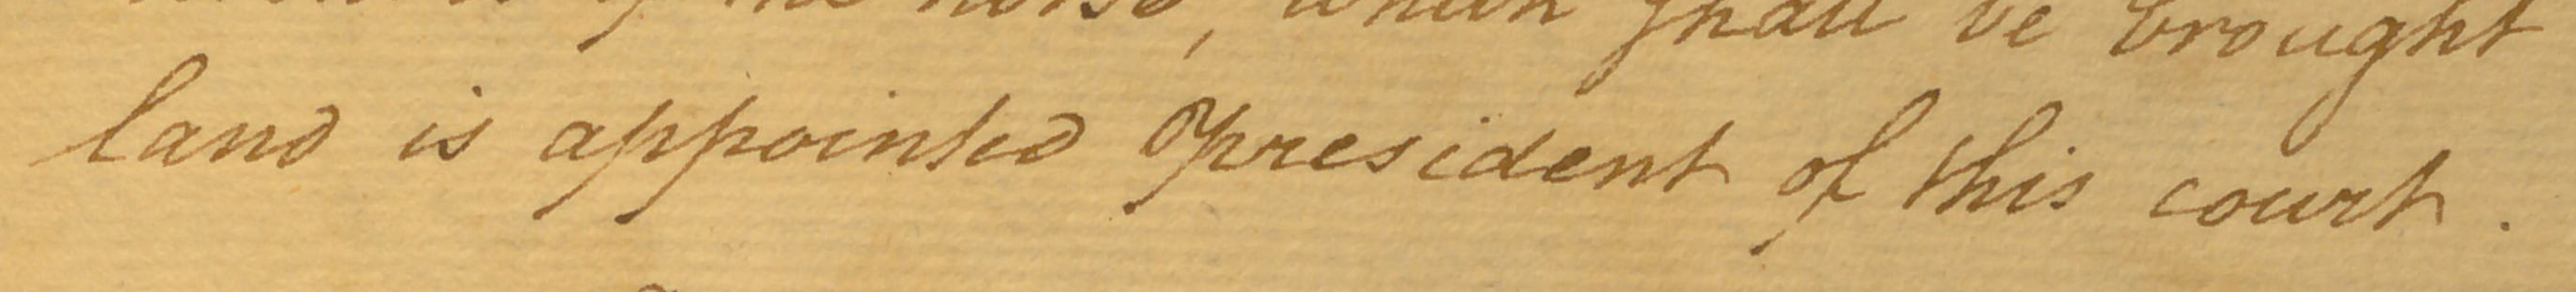land is appointed president of this court.
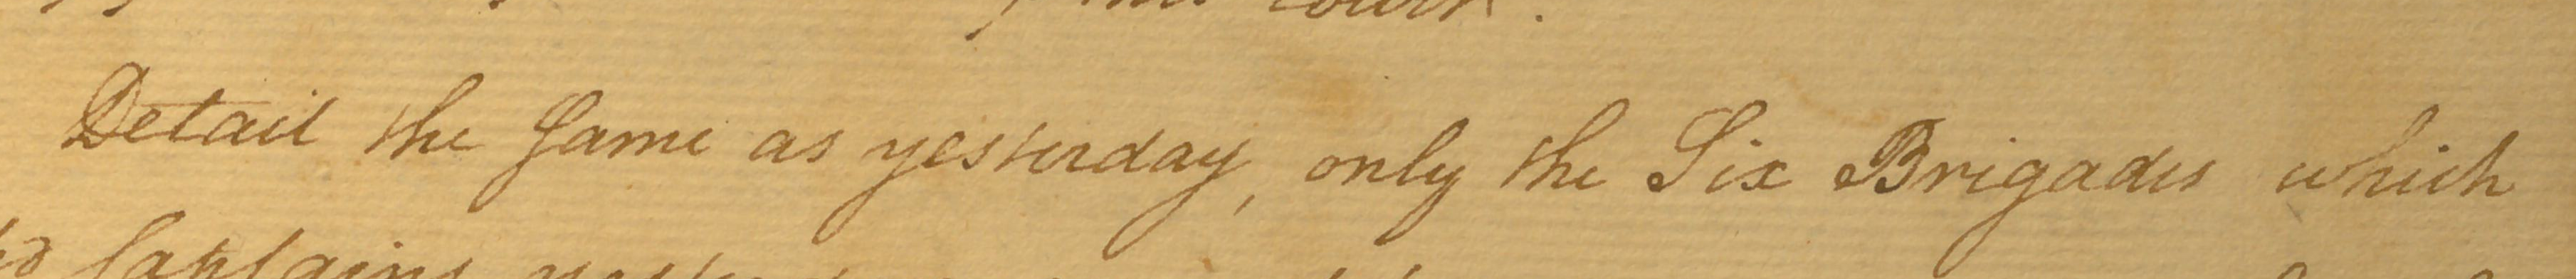Detail the same as yesterday, only the Six Brigades which
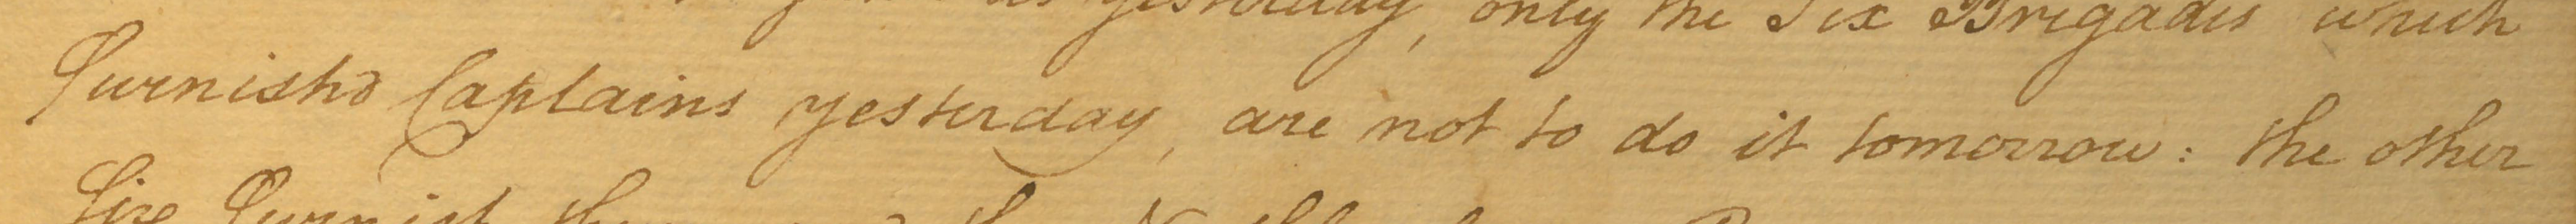furnishd Captains yesterday, are not to do it tomorrow: the other
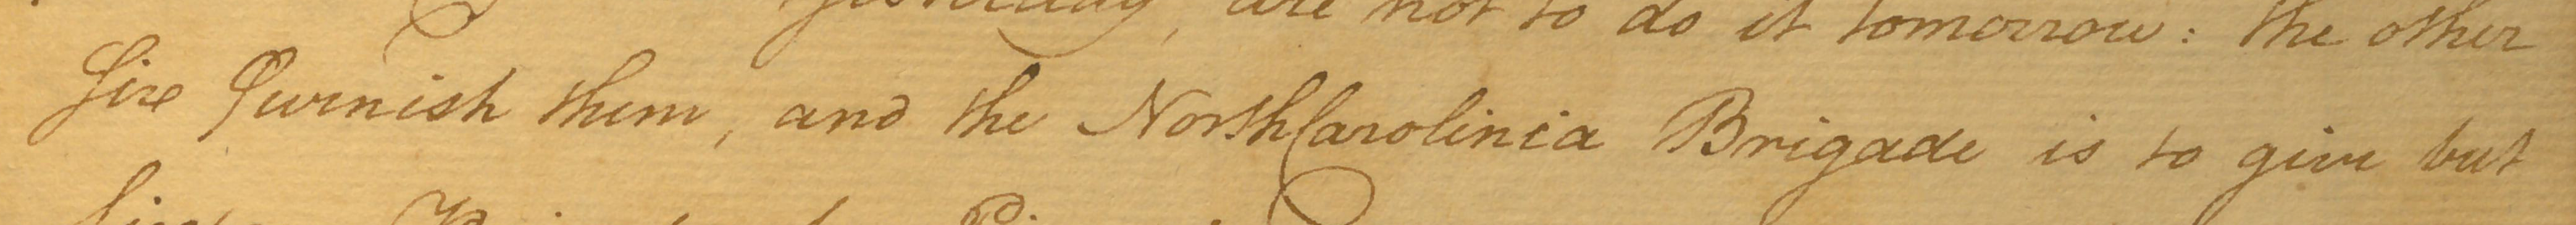Six Punish them, and the North Carolina Brigade is to give but
